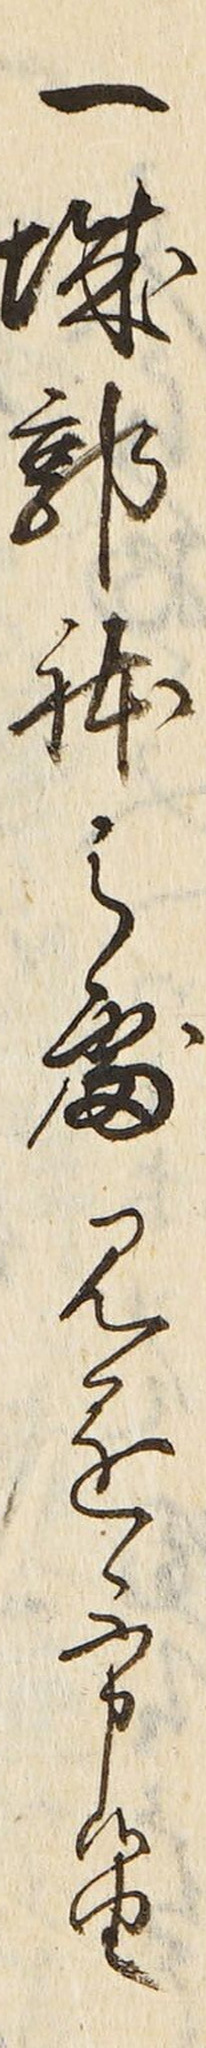一城郭躰之処見懸不申候由
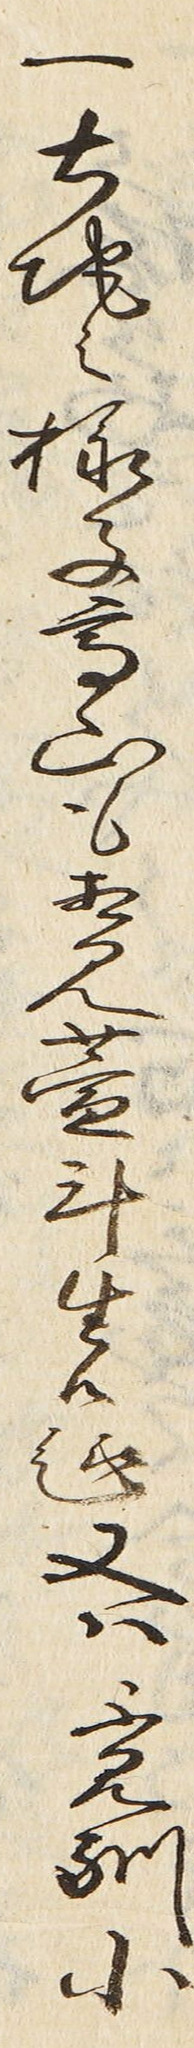一土地之様子高山も相見萱計生候趣又は不見馴小
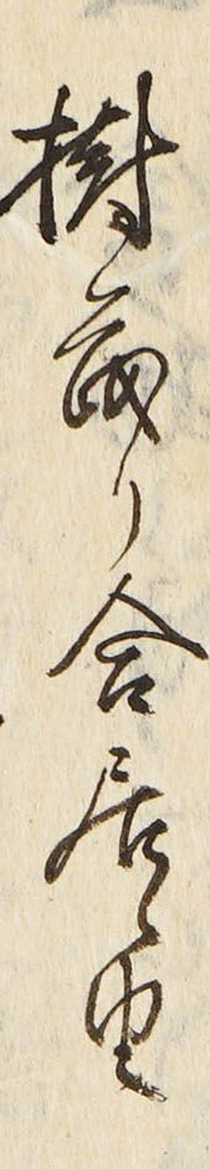樹茂り合居候由
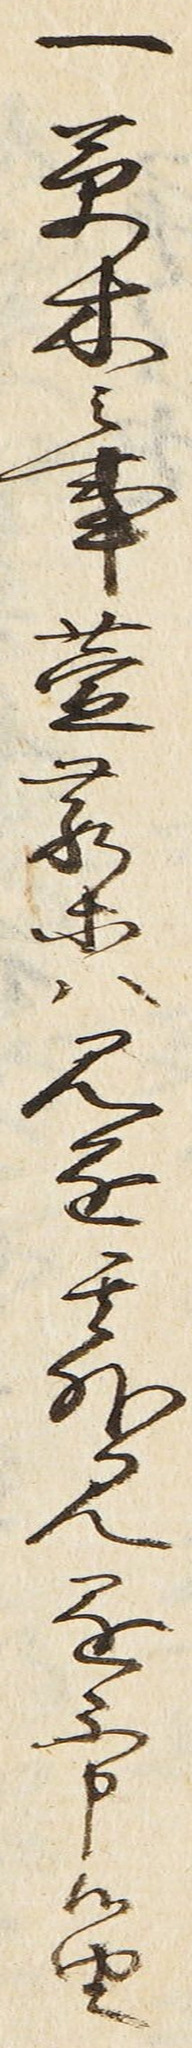一草木之事萱薮等は見懸其外見懸不申候由
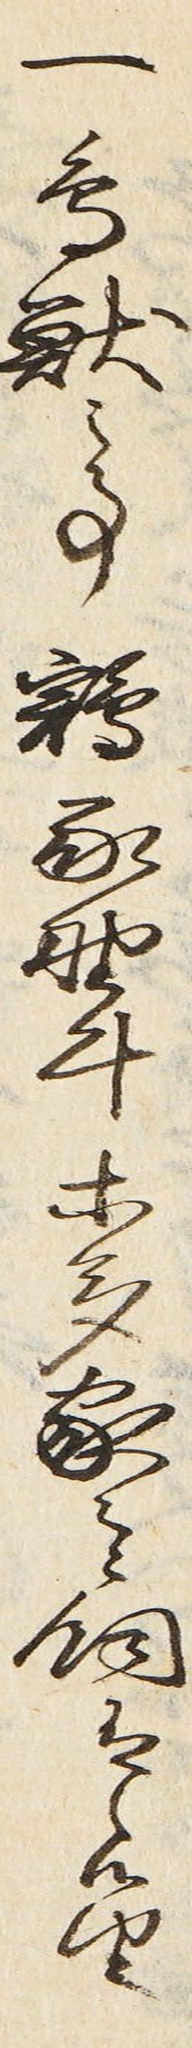一鳥獣之事鶏豕野牛等多家々に飼有之候由
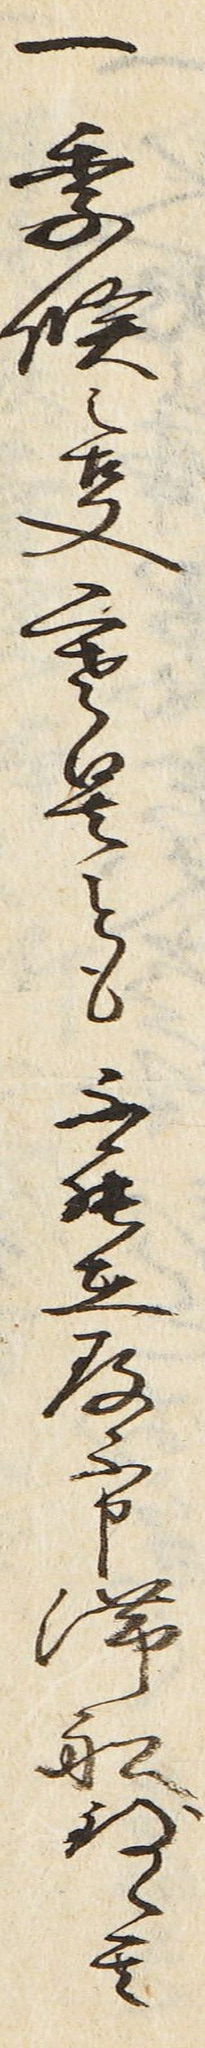一季候之事寒暑とも不罷在存不申滞船致候は
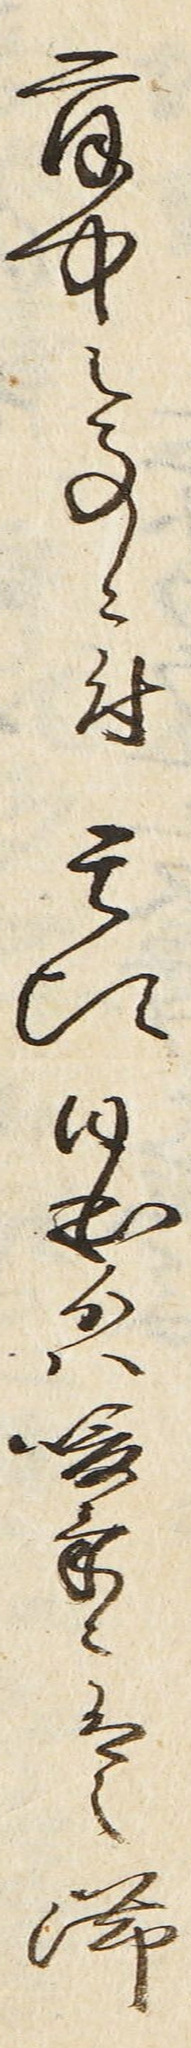二月中之事に付其比日本ゟは暖気に有之滞
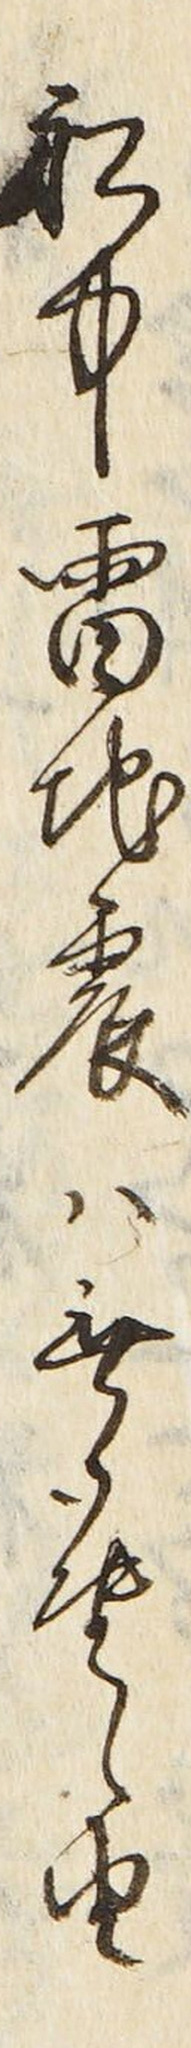船中雷地震は無御坐候由
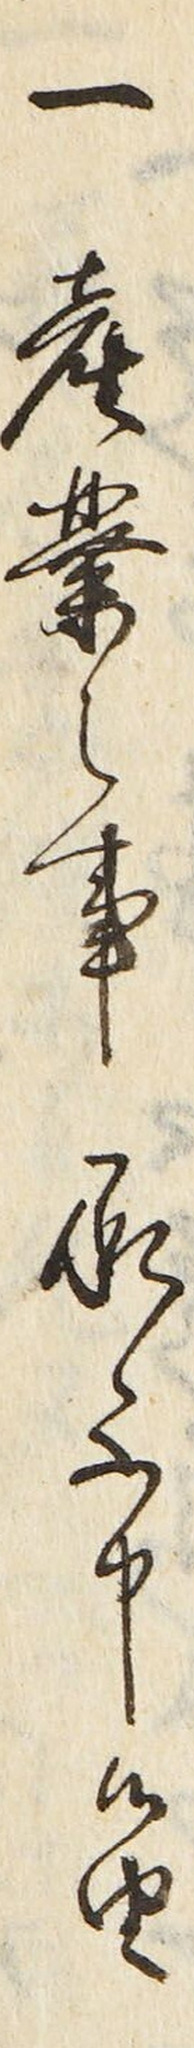一産業之事承不申候由
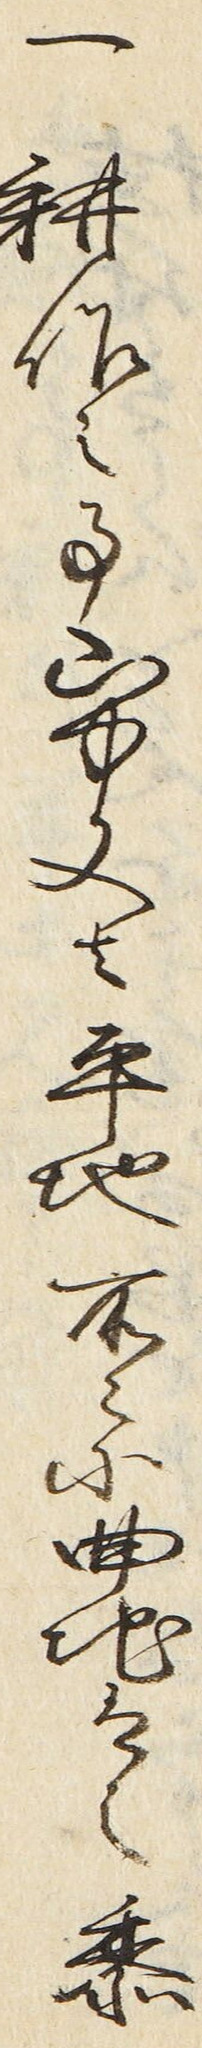一耕作之事山中又は平地所々小曲地有之黍

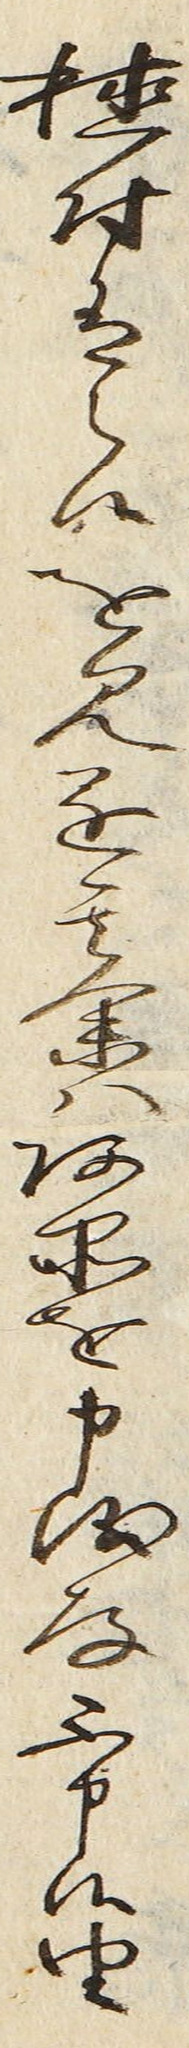植附有之候を見懸其余は阿品を申儀存不申候由
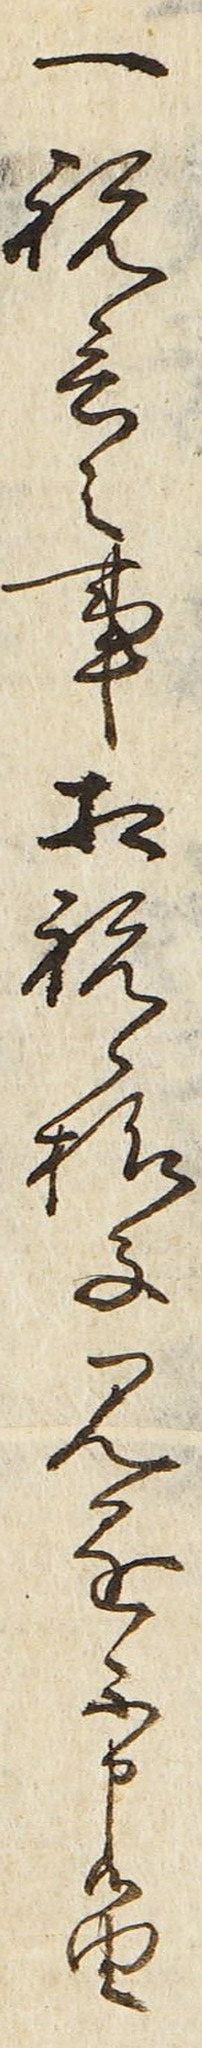一祝言之事相祝候様子見懸不申候由
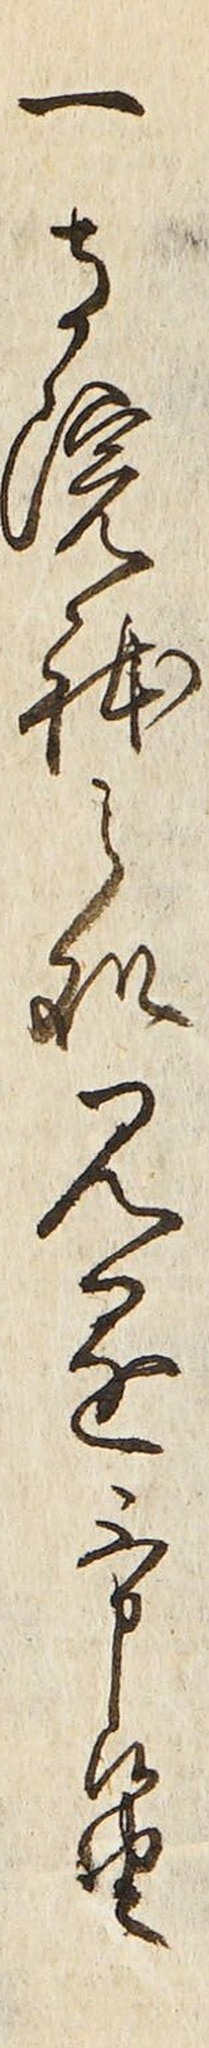一寺院躰之処見懸不申候由
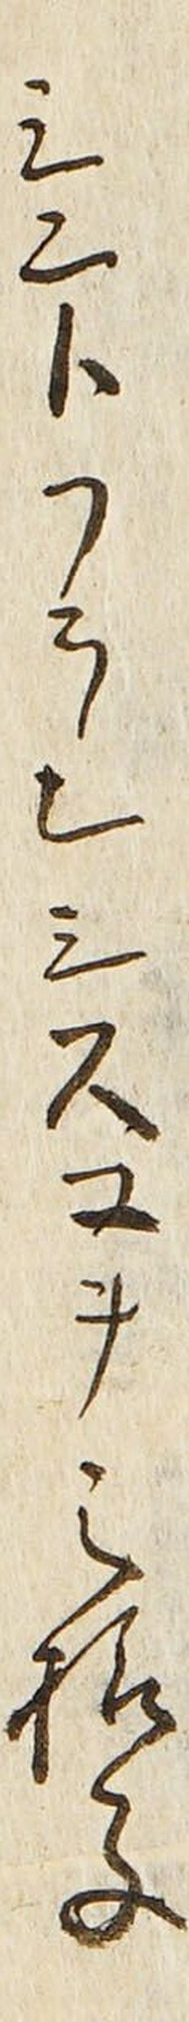シントフランシスコヲ之様子
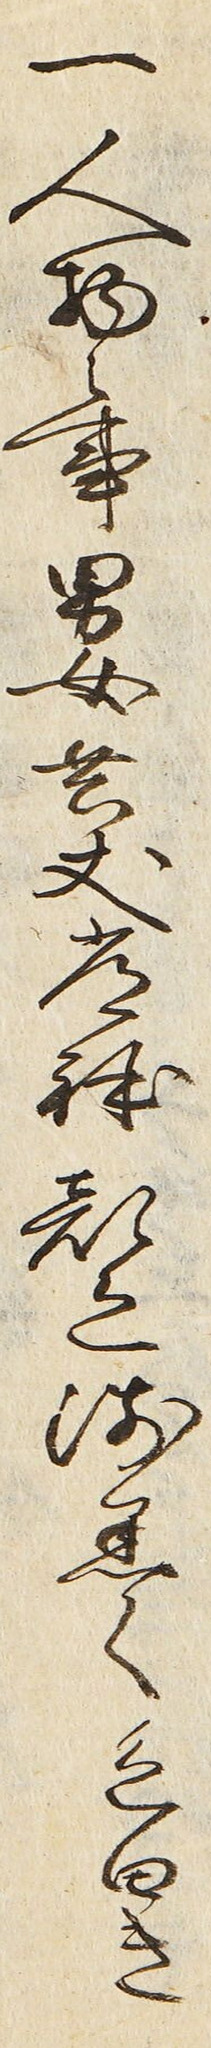一人物之事男女共丈常躰顔色浅黒く色白き
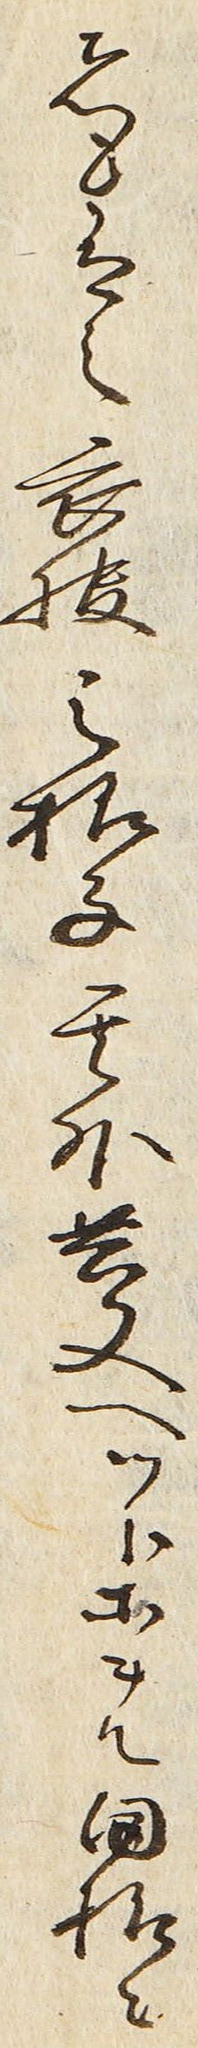者も有之衣服之様子其外共ヌヘツトホヲル同様に
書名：土佐中浜万次郎漂流記
